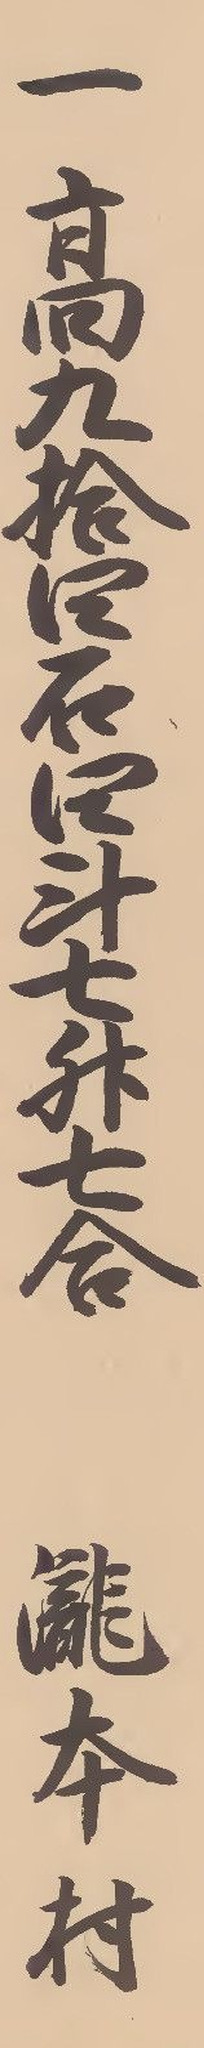一高九拾四石四斗七升七合滝本村
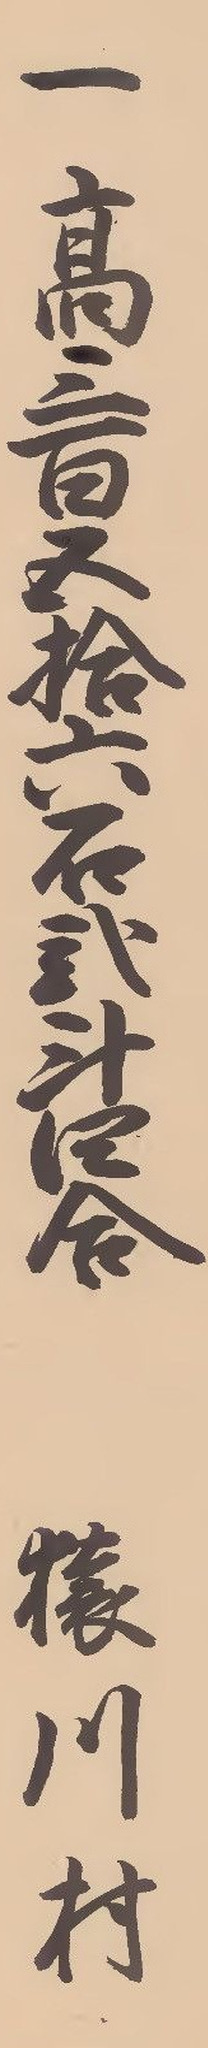一高三百五拾六石弐斗四合猿川村
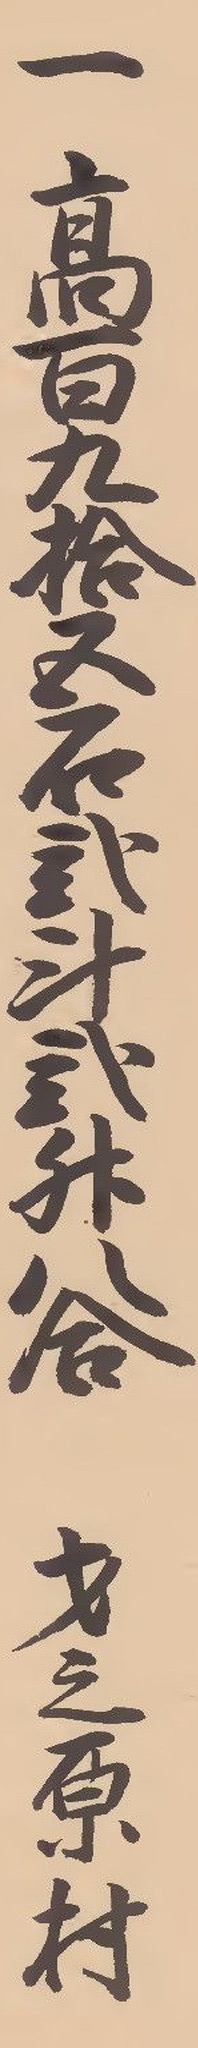一高百九拾五石弐斗弐升八合才之原村
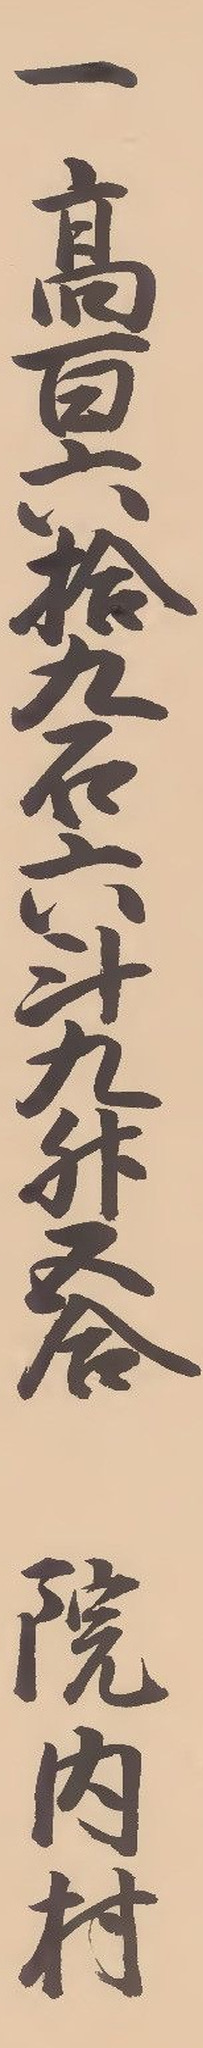一高百六拾九石六斗九升五合院内村
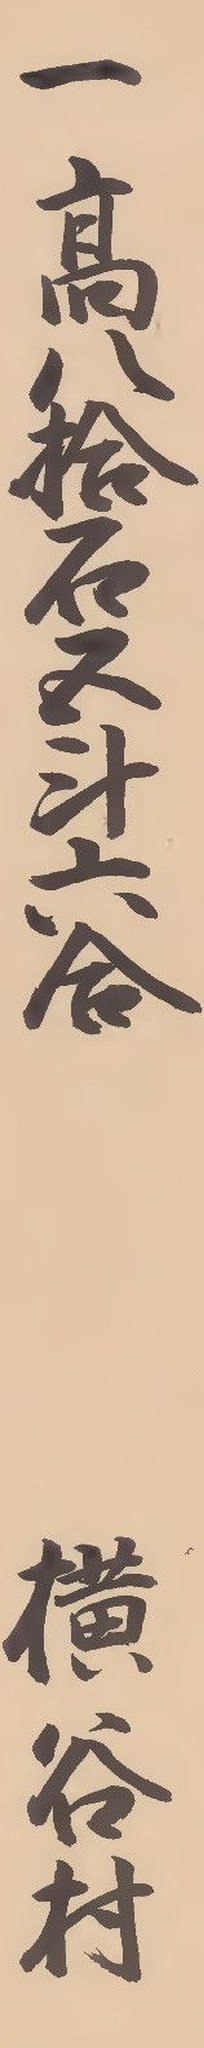一高八拾石五斗六合横谷村
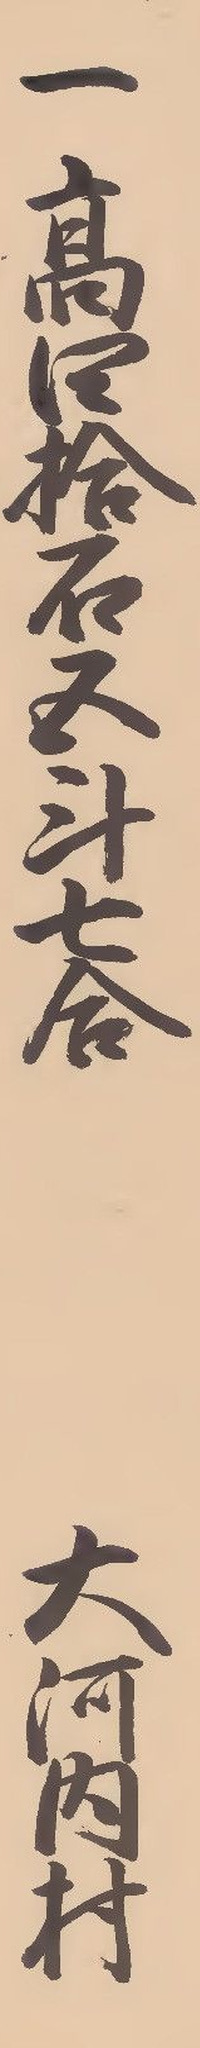一高四拾石五斗七合大河内村

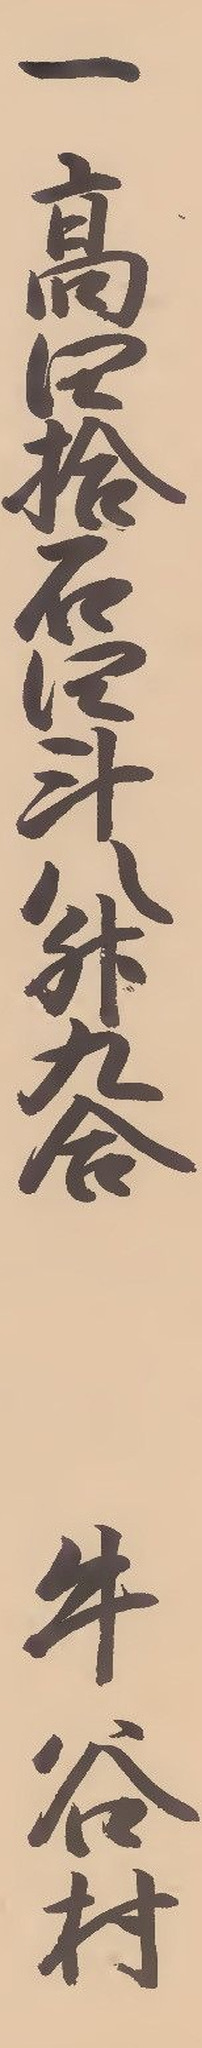一高四拾石四斗八升九合牛谷村
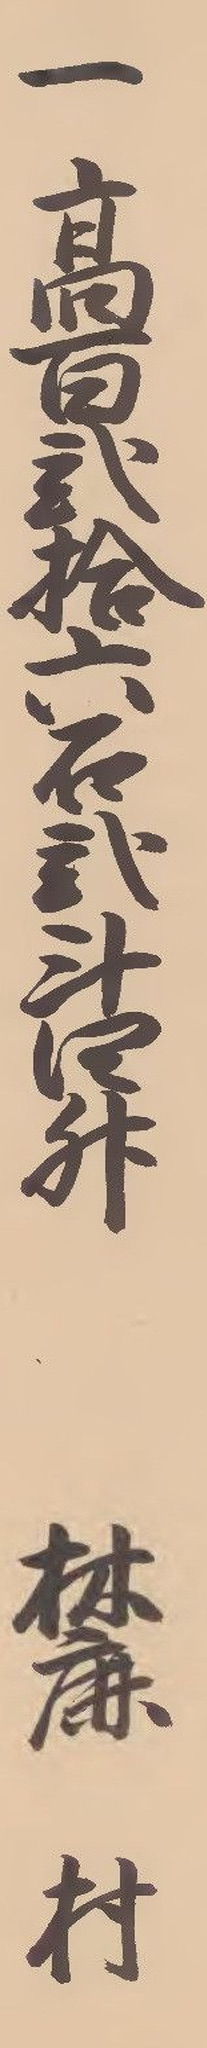一高百弐拾六石弐斗四升麓村
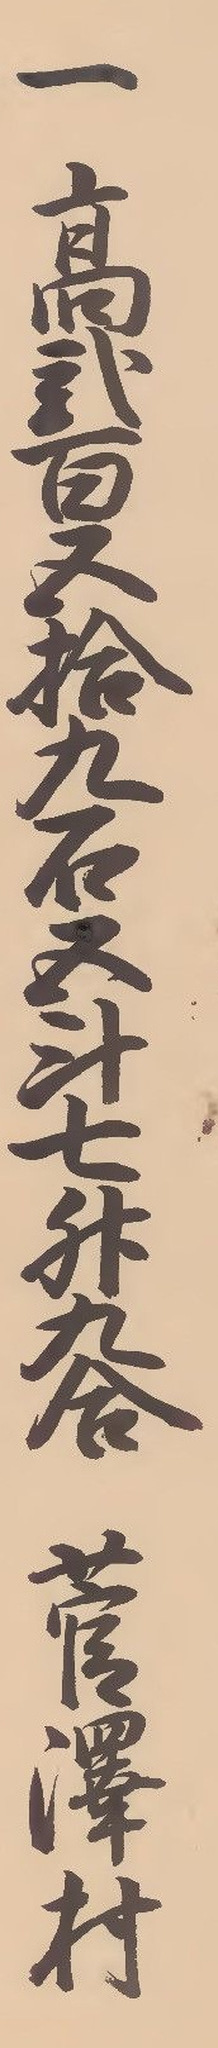一高弐百五拾九石五斗七升九合菅沢村
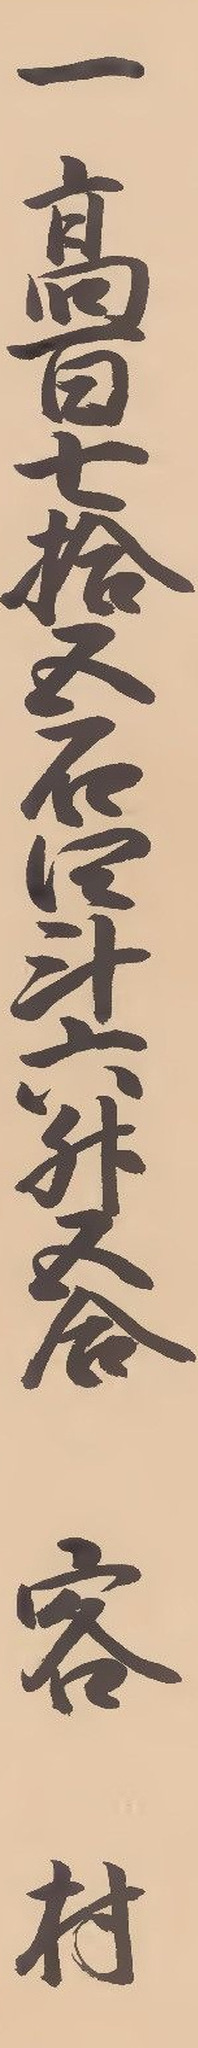一高百七拾五石四斗六升五合客村
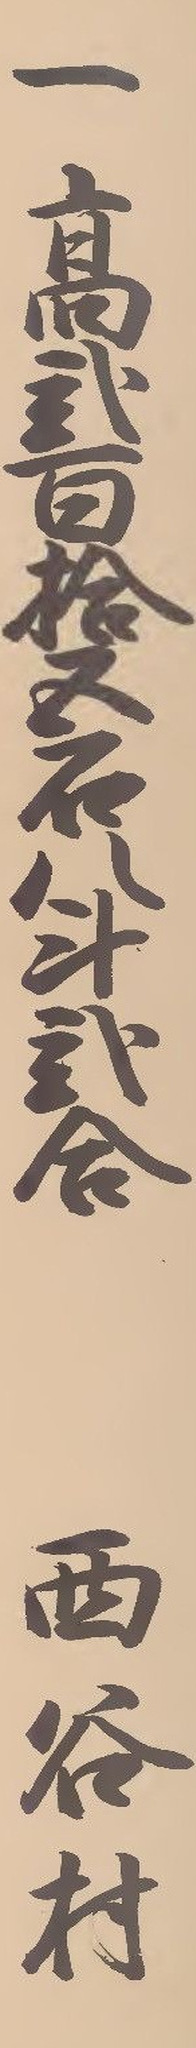一高弐百拾五石八斗弐合西谷村
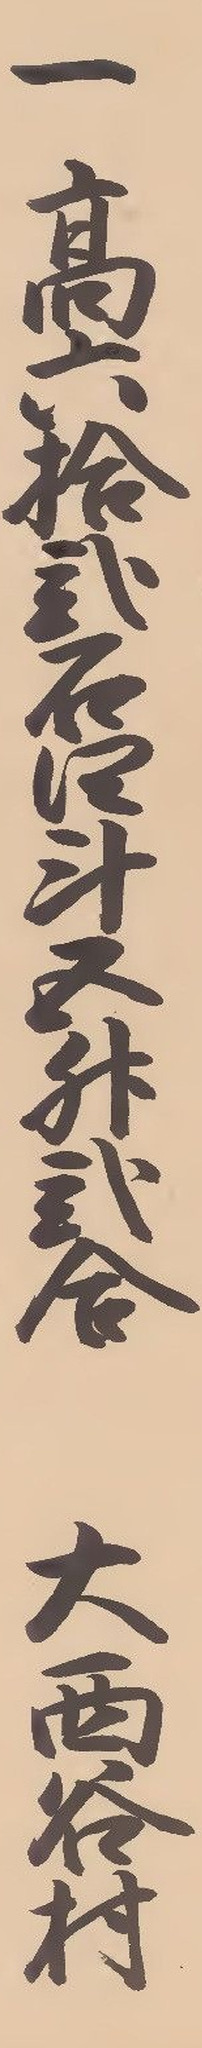一高六拾弐石四斗五升弐合大西谷村
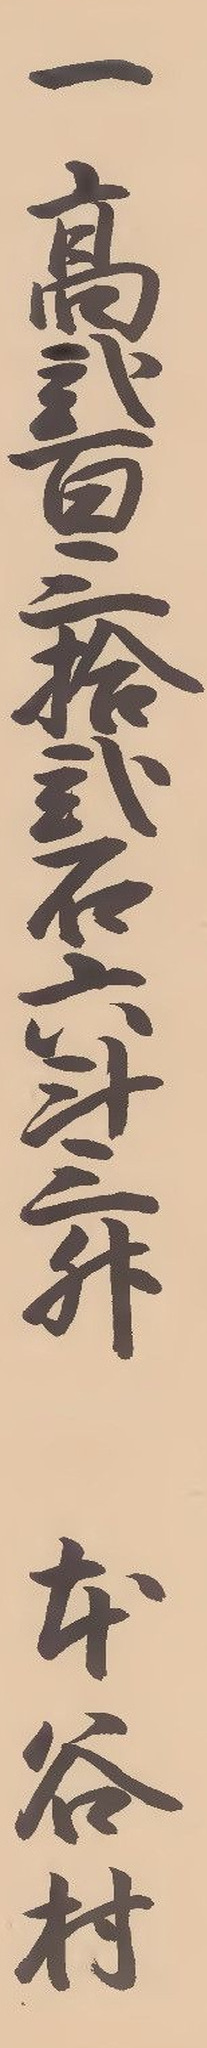一高弐百三拾弐石六斗三升本谷村
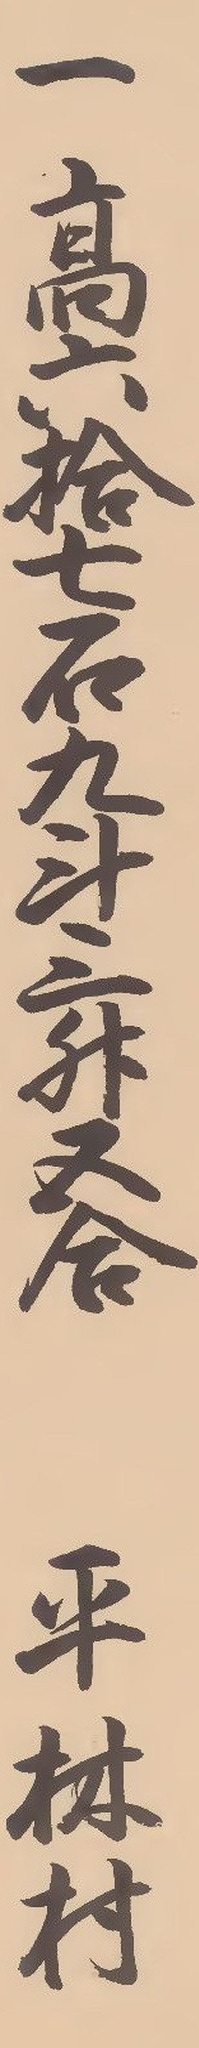一高六拾七石九斗三升五合平林村

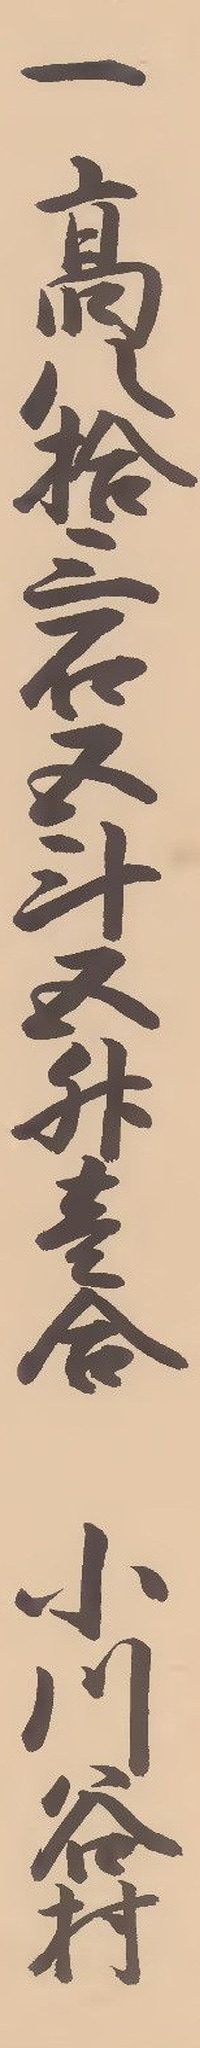一高八拾三石五斗五升壱合小川谷村
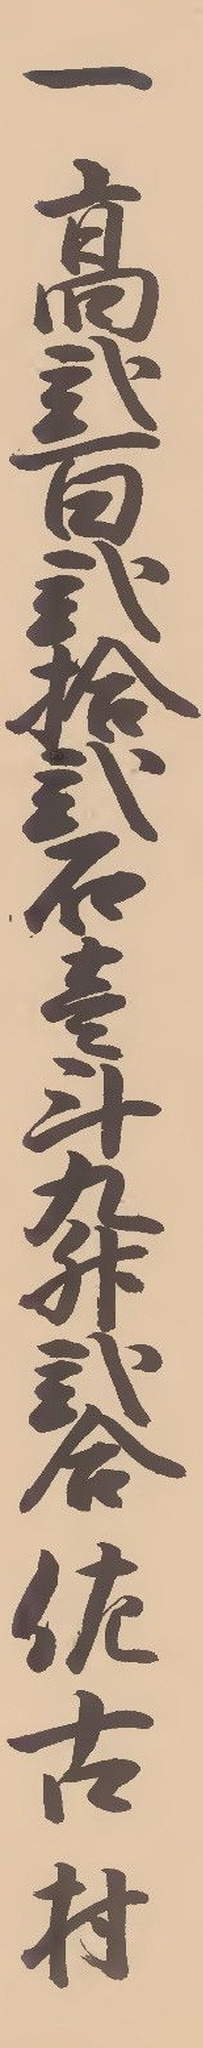一高弐百弐拾弐石壱斗九升弐合佐古村
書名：伊予国郷帳
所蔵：国立公文書館 National Archives of Japan
